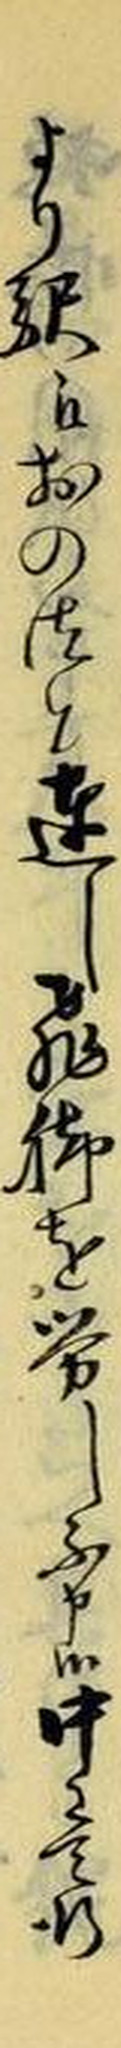より駅江おのつと達し飛脚を労し不申候中にて行
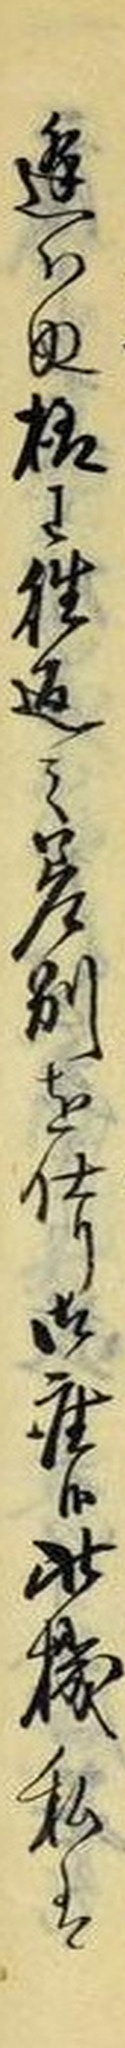違ハぬ様に往返の差別を仕り御座候此機私は
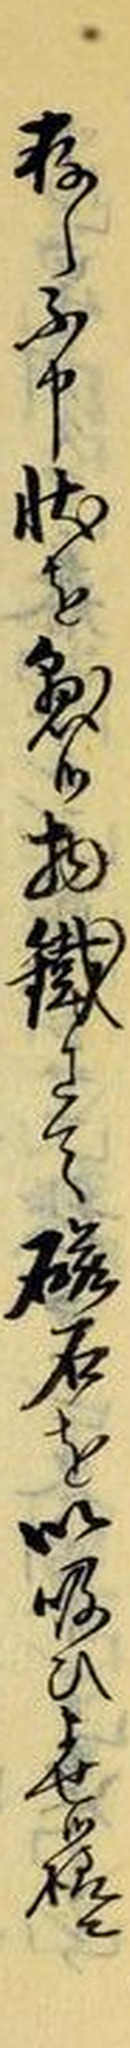存し付さる状を魚候物鉄にて磁石を以吸ひよせ候様ニ
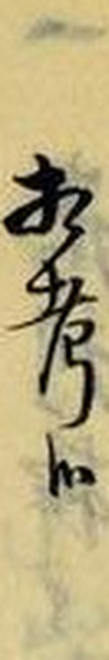相考候
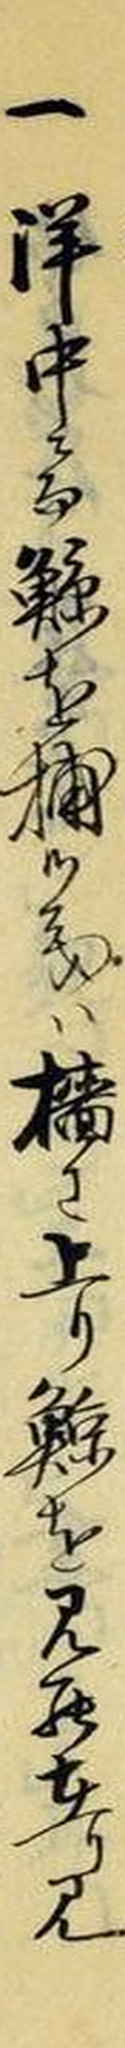一洋中二而鯨を捕候義ハ檣に上り鯨を見罷在り見
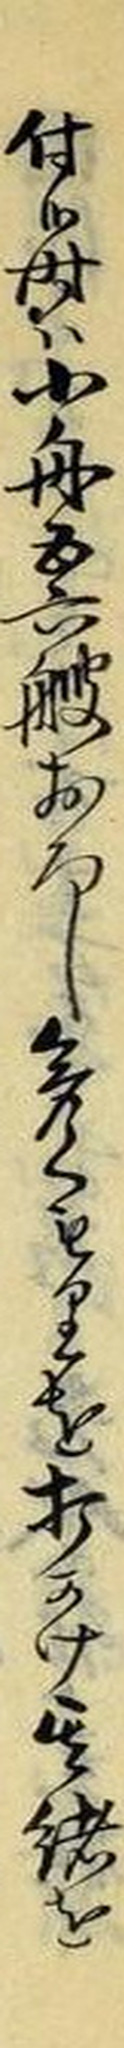付候時ハ小舟五六艘おろし多くもりを打かけ其緒を
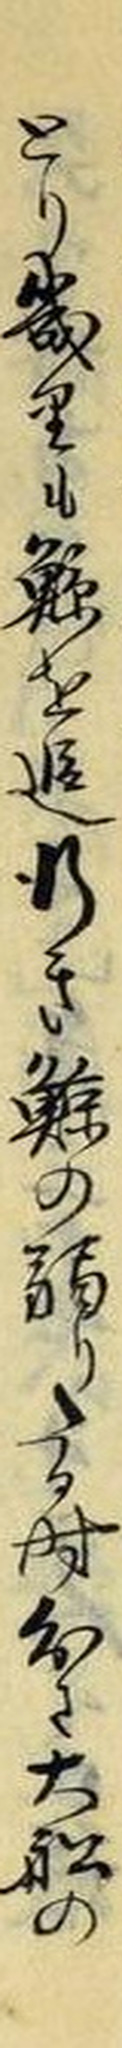とり幾里も鯨を追行き鯨の弱りたる時分に大船の
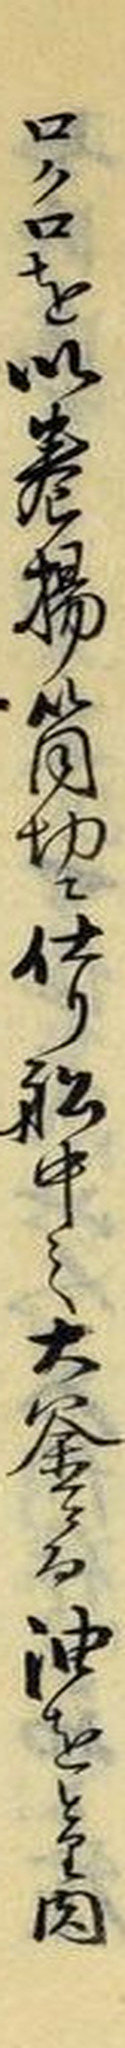ロクロを以巻揚筒切ニ仕り船中之大釡ニ而油をとり肉
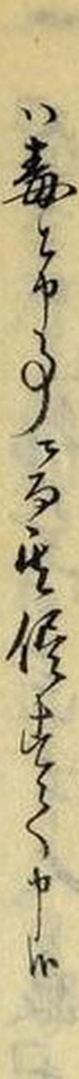ハ毒と申事ニ而其侭すて申候
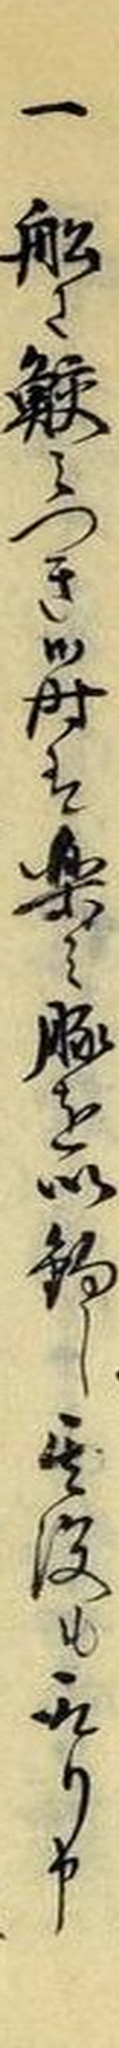一船に鯨之つき候時は楽之豚を以釣し其後も取り申
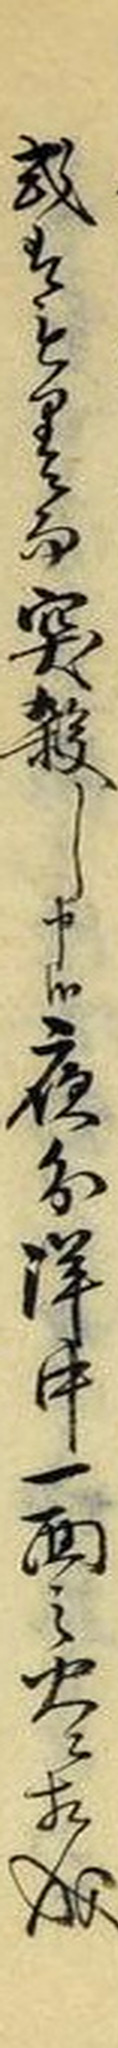或はもりニ而突殺し申候夜分洋中一面之火ニ相成
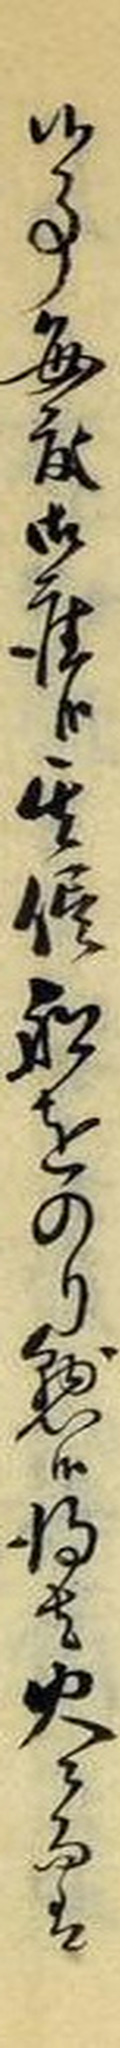候事毎夜御座候其侭船をのり漁候得者火ニ而は
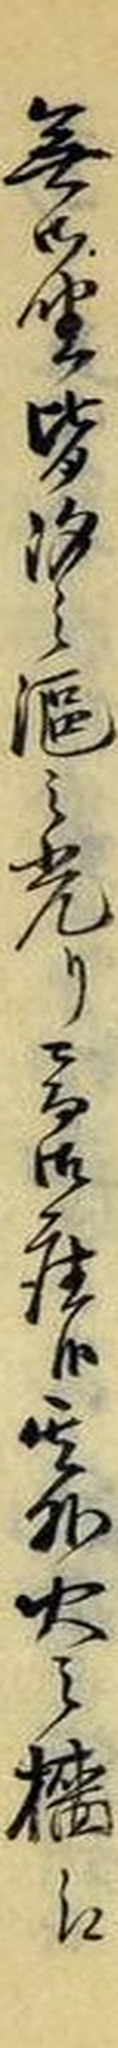無御座皆汐之泡之光りニ而御座候其外火之檣江
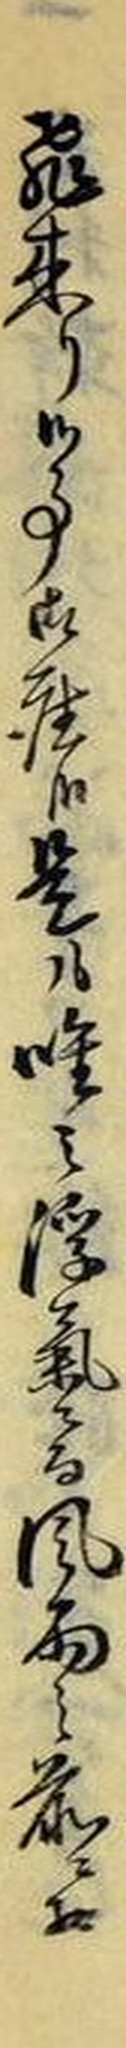飛来り候事御座候是も唯之浮気ニ而風雨之前ニ相

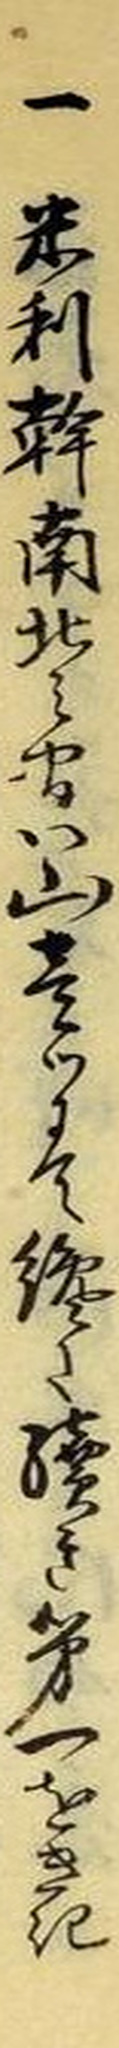一米利幹南北之間ハ山一ツにて縦に続き第一をき
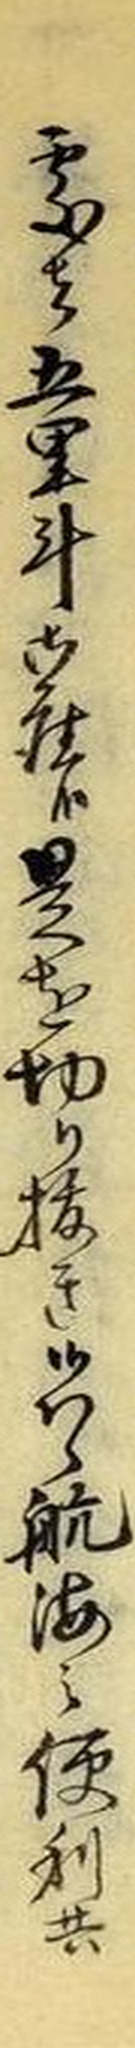處者五里計御座候是を切り抜き候ハゝ航海之便利共
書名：漂客談奇（備考雑録写8）
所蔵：福井県文書館 Fukui Prefectural Archives
